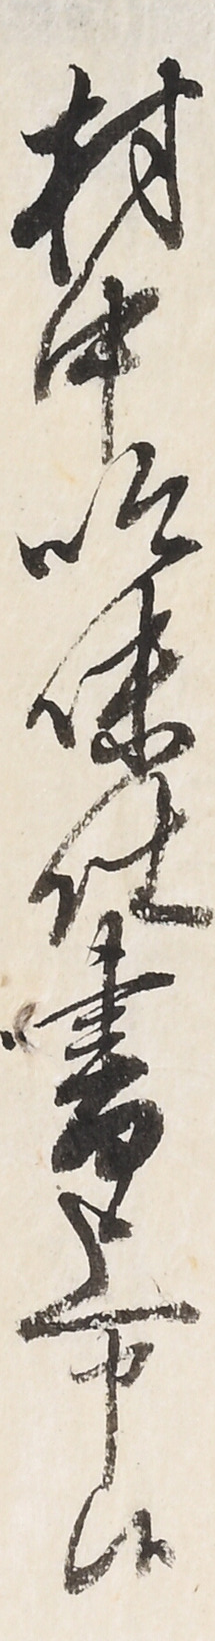村中吟味仕書上申候
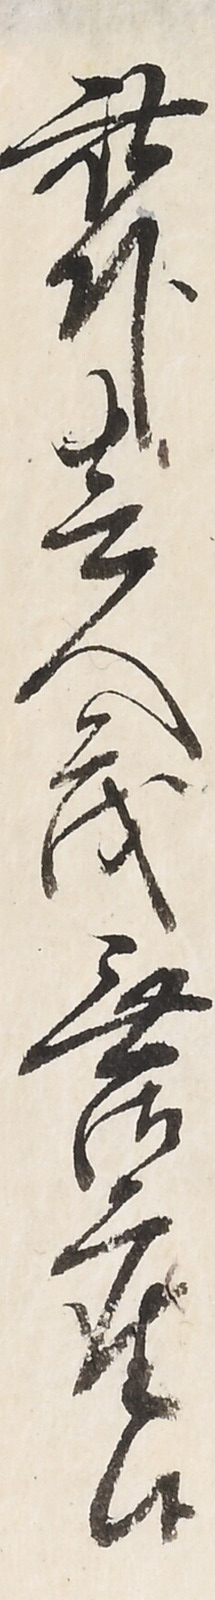此外壱人も無御座候
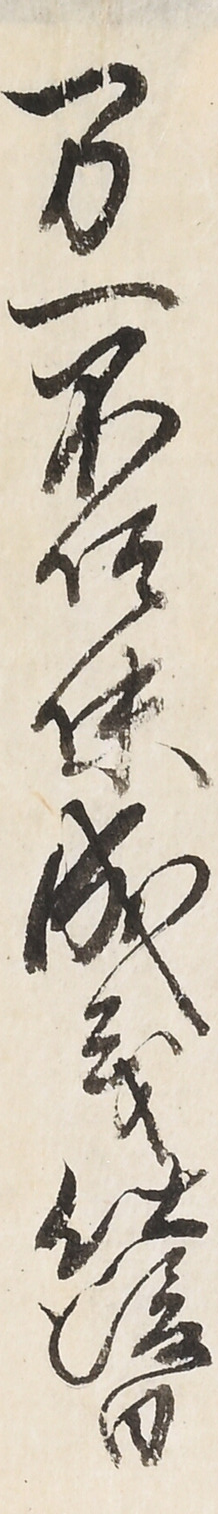万一不吟味成義仕後日
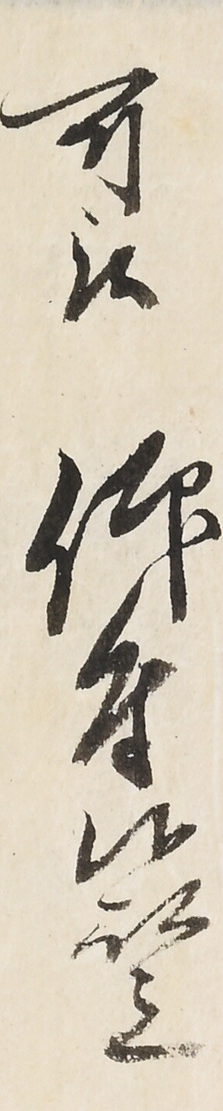可被仰付候以上
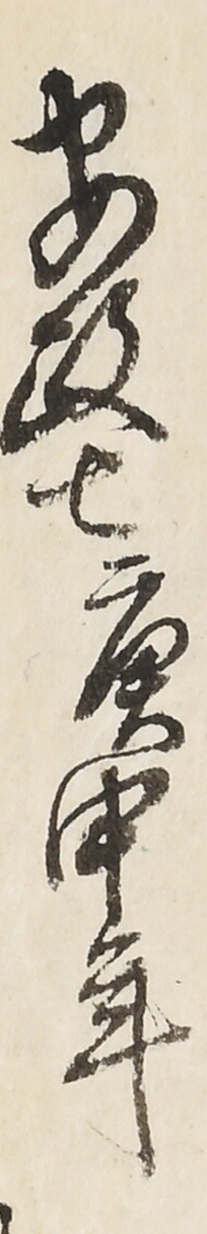安政七庚申年
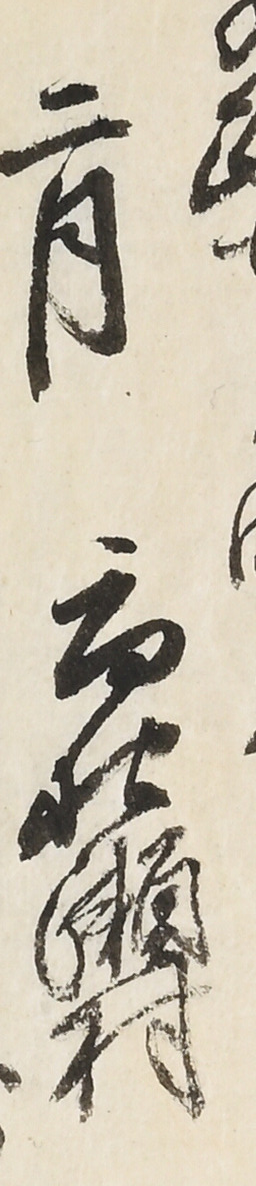二月市野瀬村
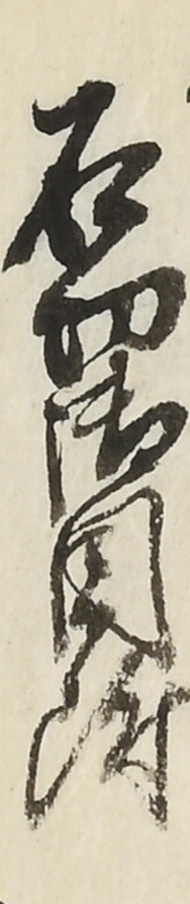石切御目附
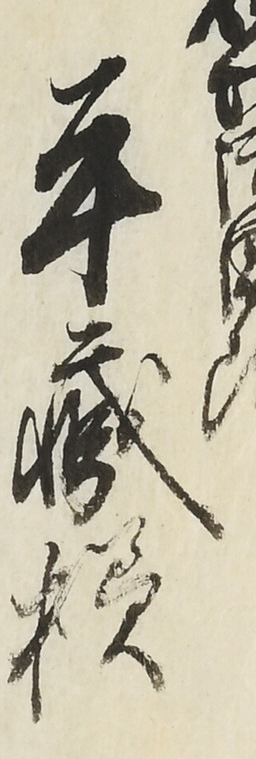平蔵様
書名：安政七庚申年二月石切旅稼名前書上帳
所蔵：伊那市立高遠町図書館・合同会社AMANE
